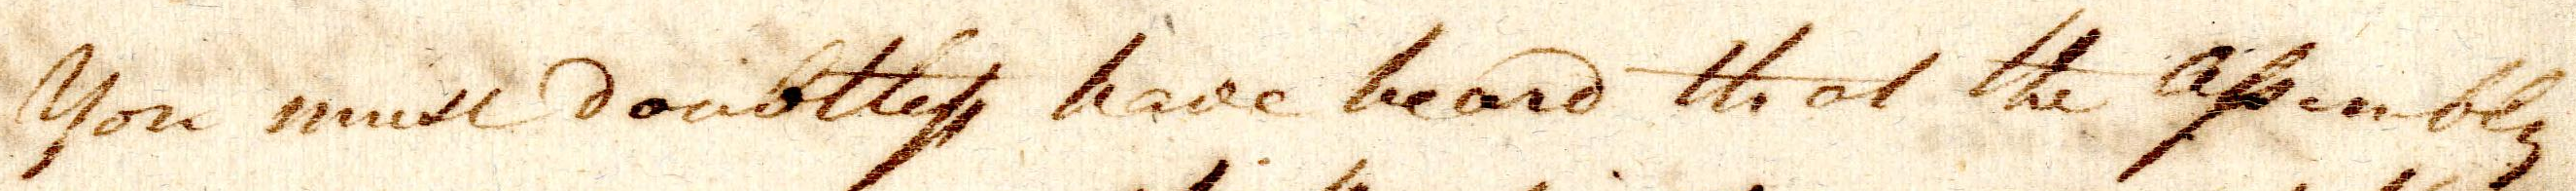You must doubtless have heard that the assembly
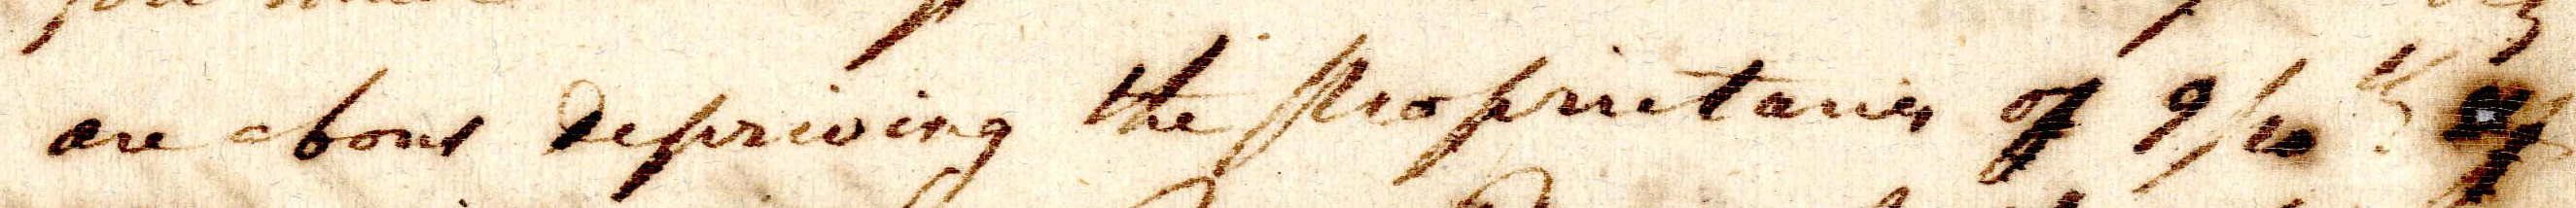are about depriving the proprietaries of 9/10 5[_]
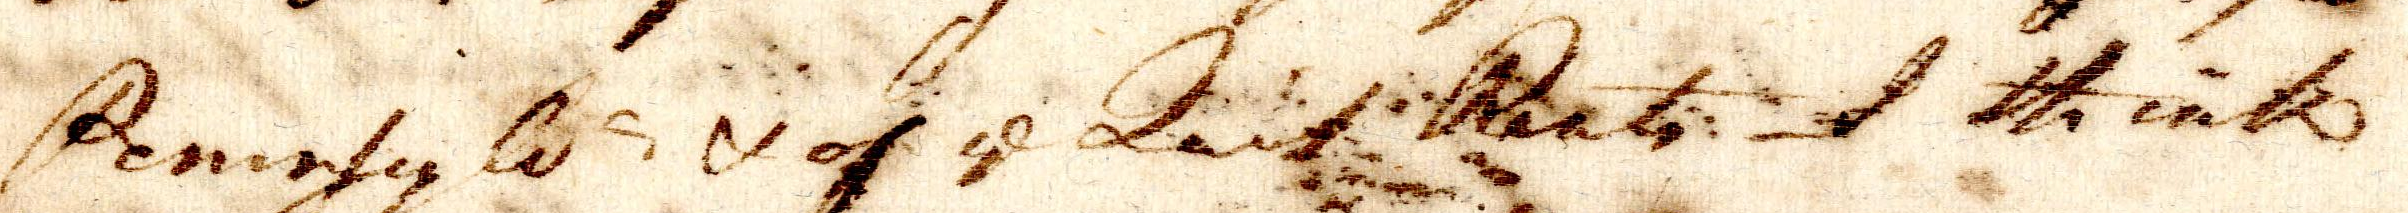Pennsylv^a & of y^e Quart Reats. I think
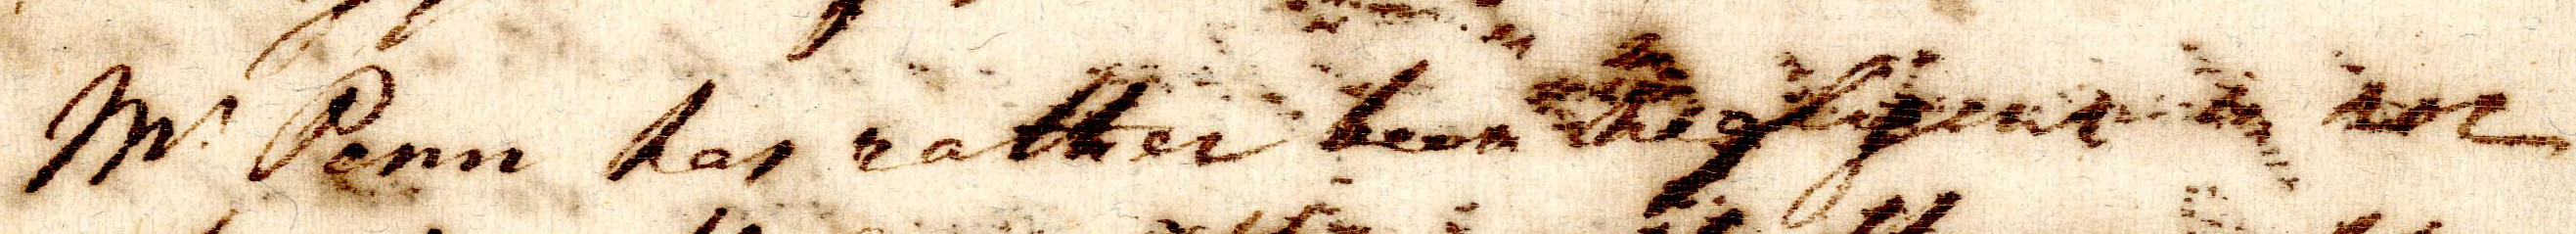M^r. Penn has rather been negligent in not
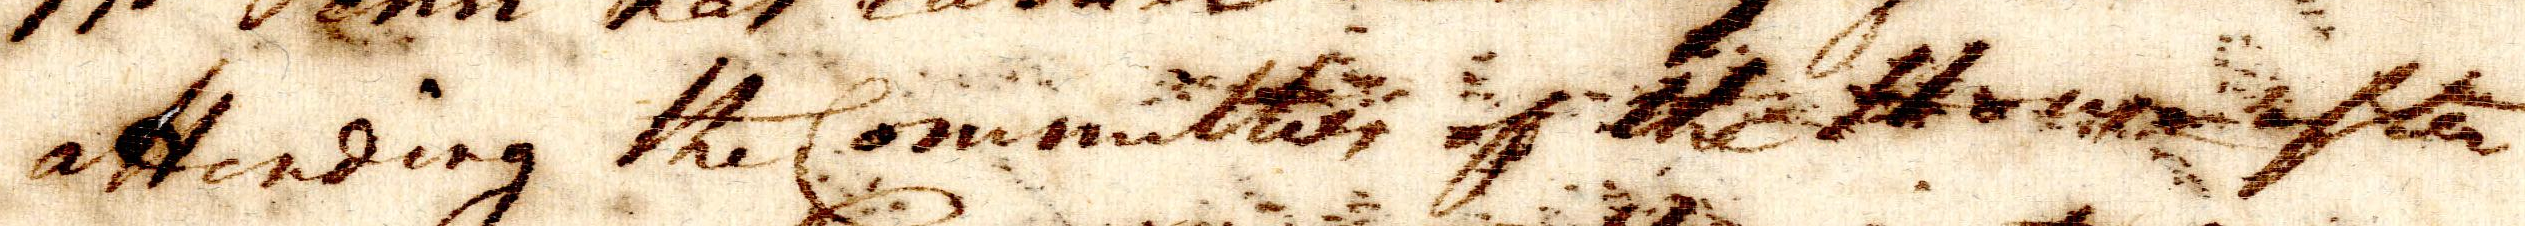attending the Committee of the House after
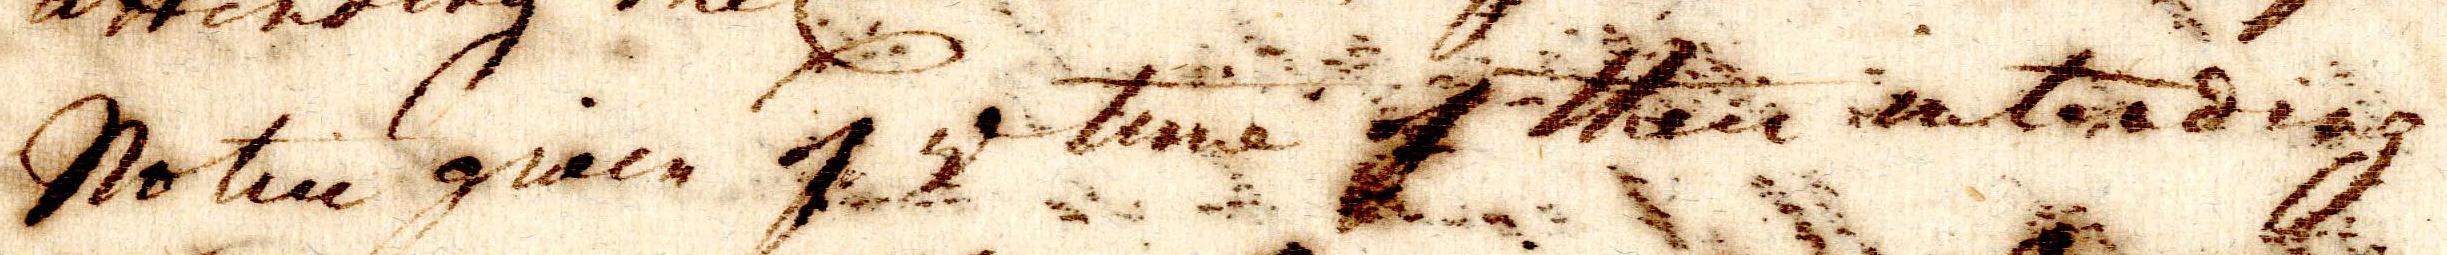Notice given of y^e time of their intending
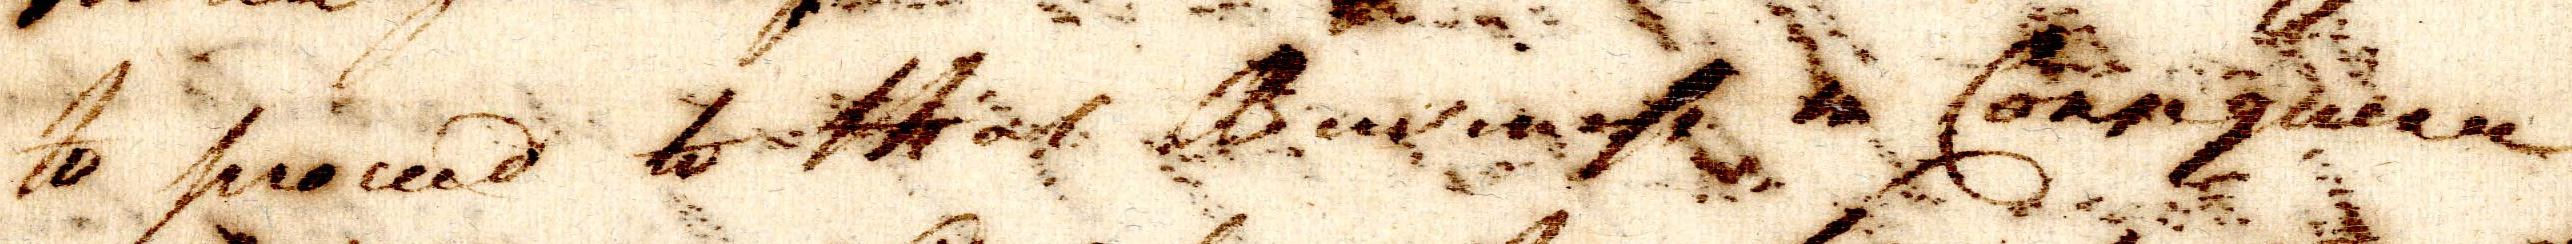to proceed to that Business in Consequence
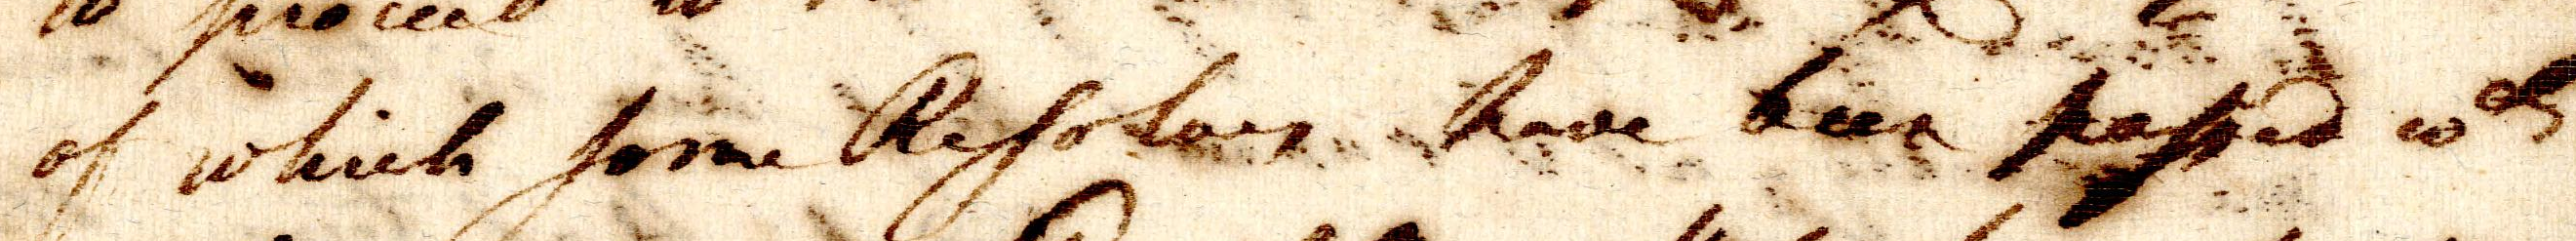of which some Resolves have been passed w^ch.
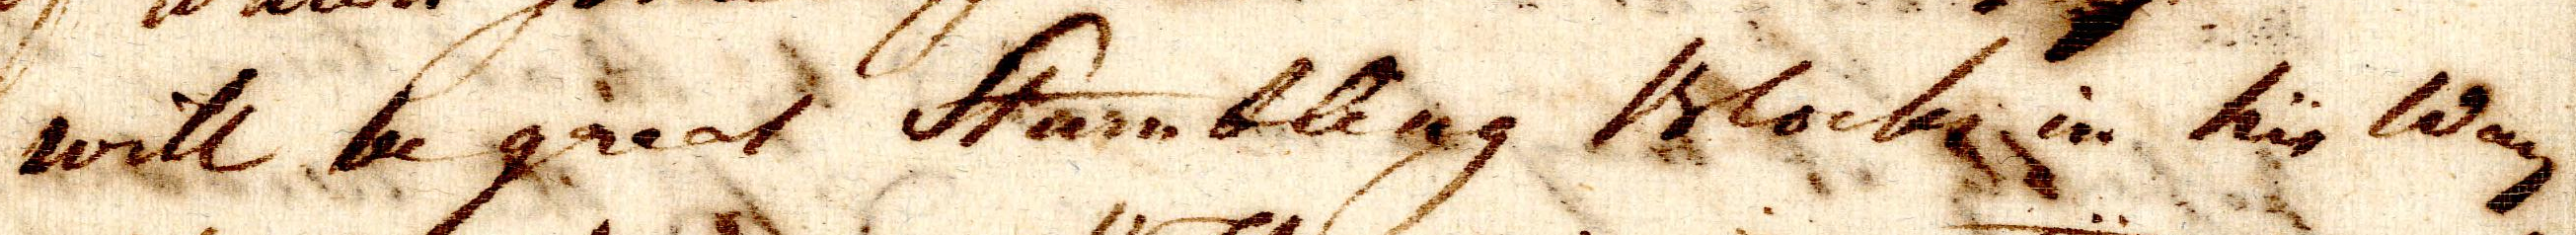will be great Stumbling Blocks in his Way
